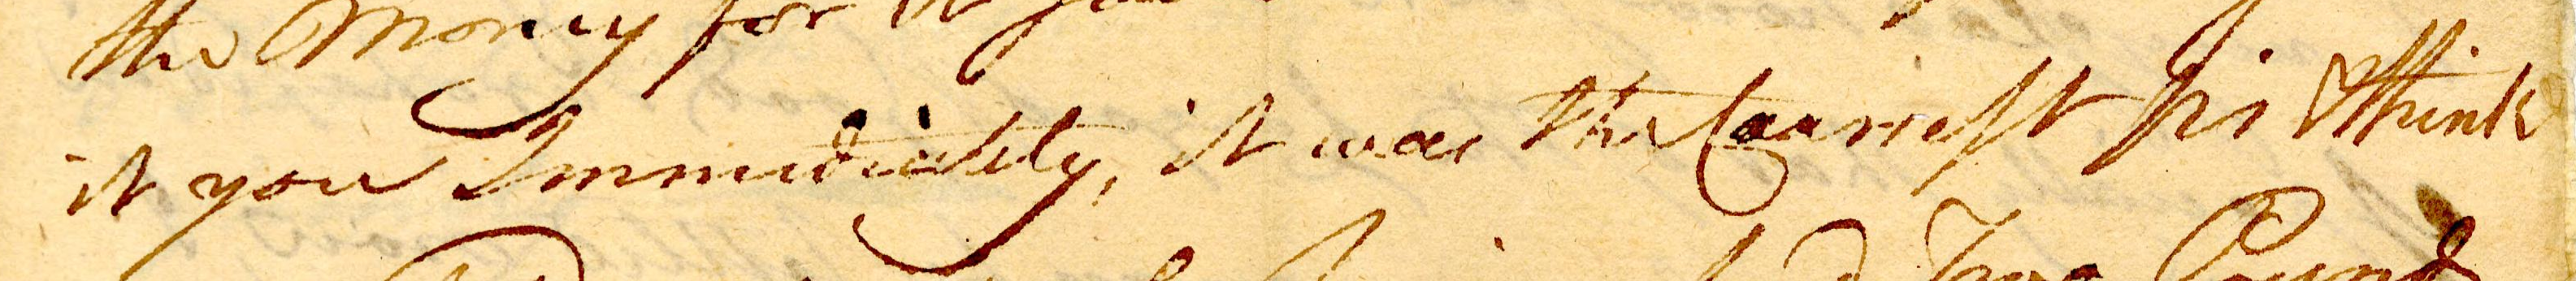it you Immediately, it was the coarest pi & think
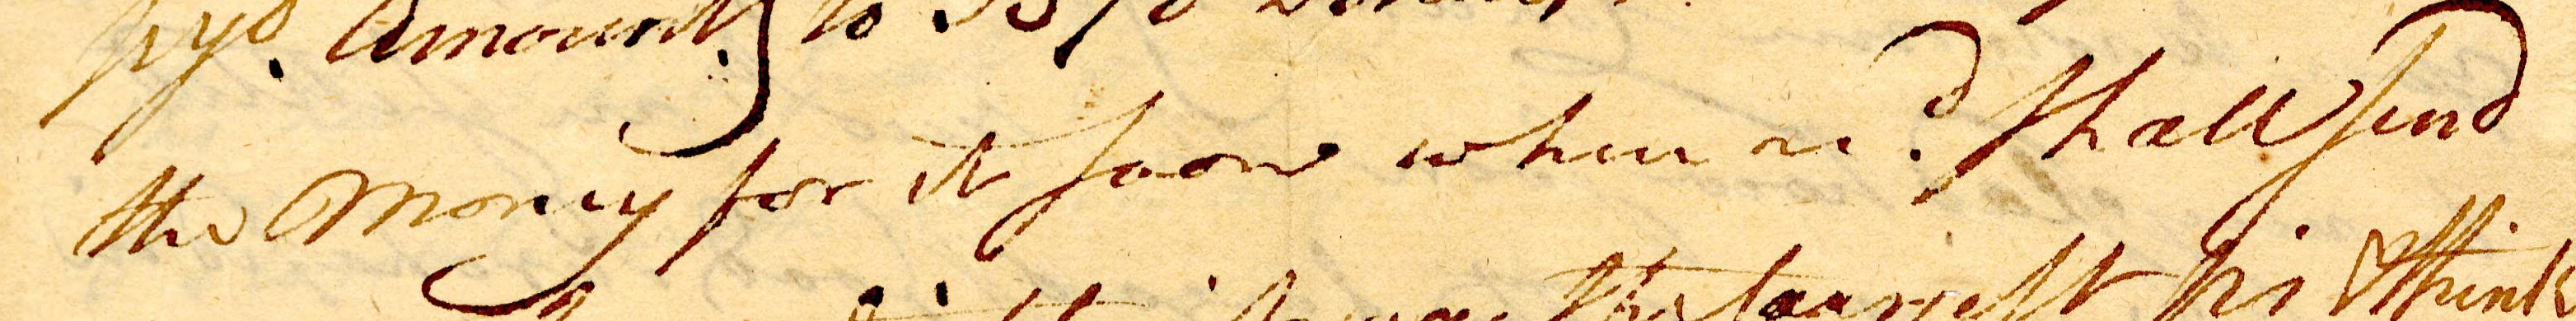the money for it soon when re^d shall send
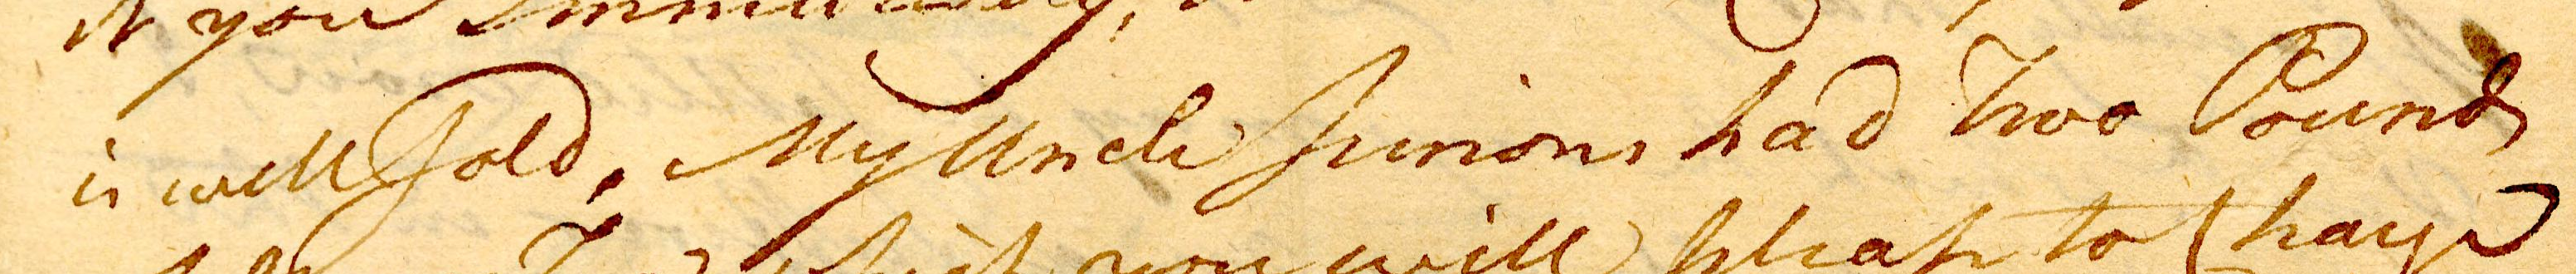is well sold, My Uncle Frenins had Two Pounds
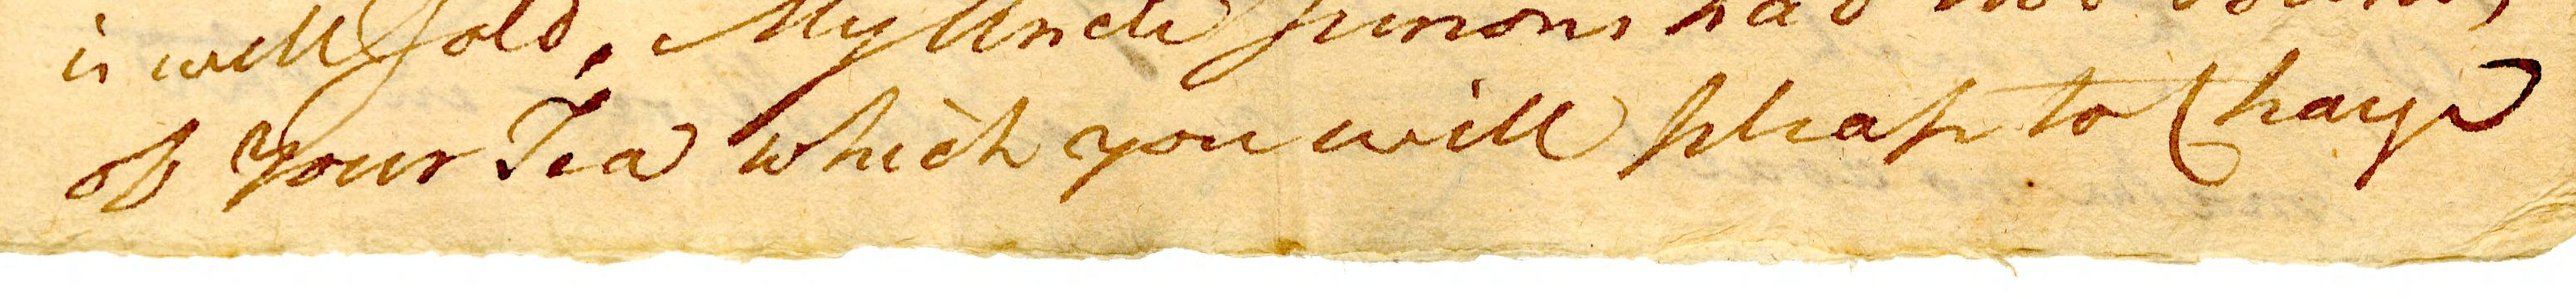of Your Tea which you will please to Charge
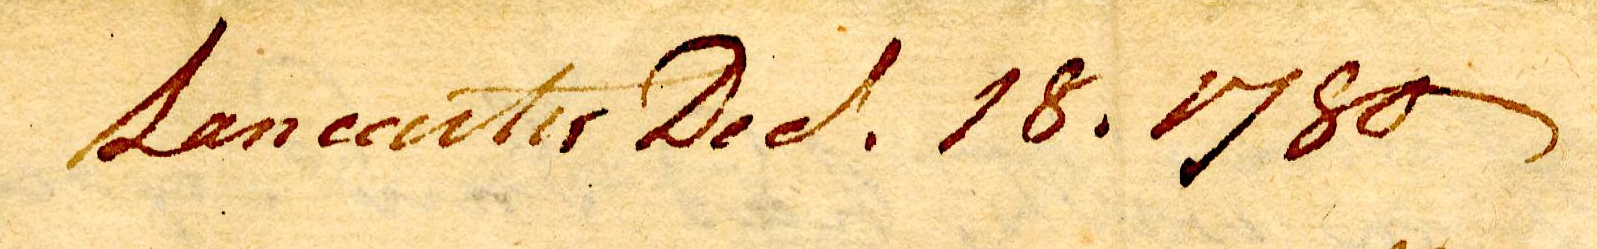Lancaster Dec^r. 18. 1780
